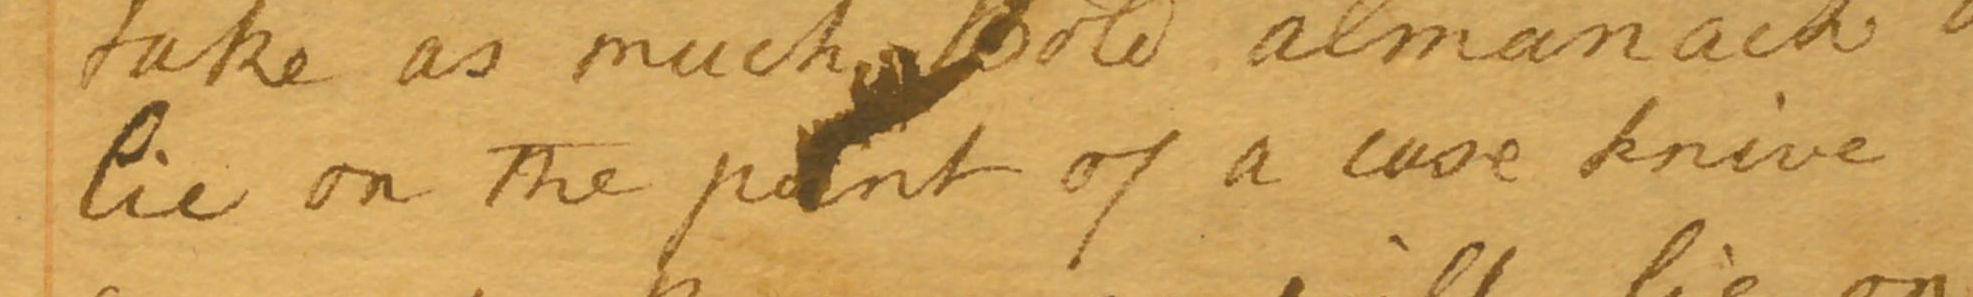lie on the point of a case knive
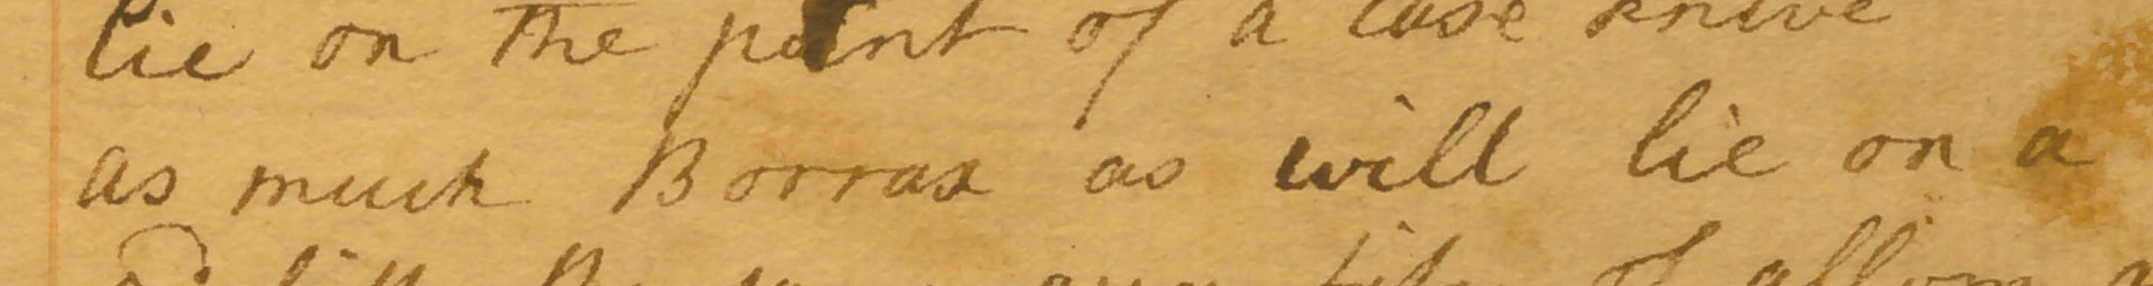as much Borrax as will lie on a
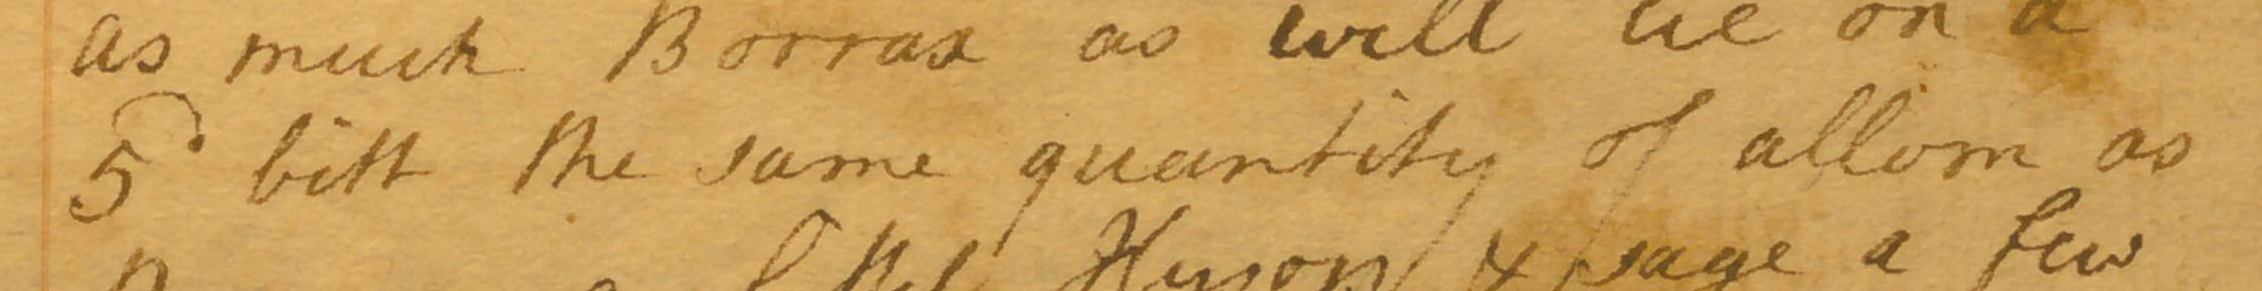5^d bitt the same quantity of allim as
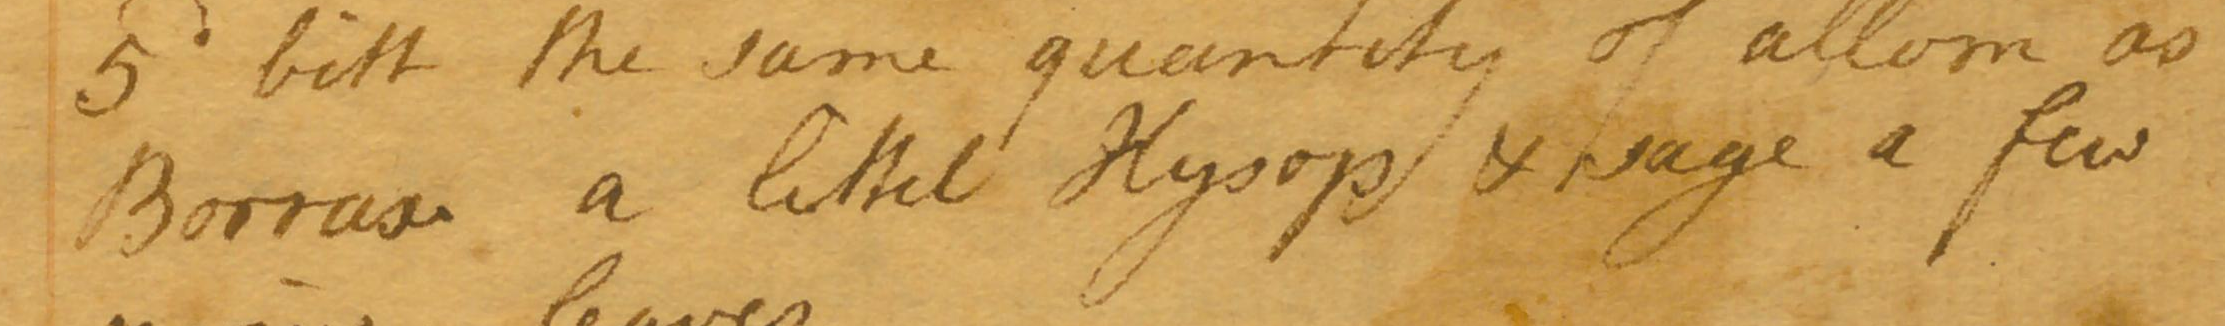Borrax a littel Hysop & sage a few
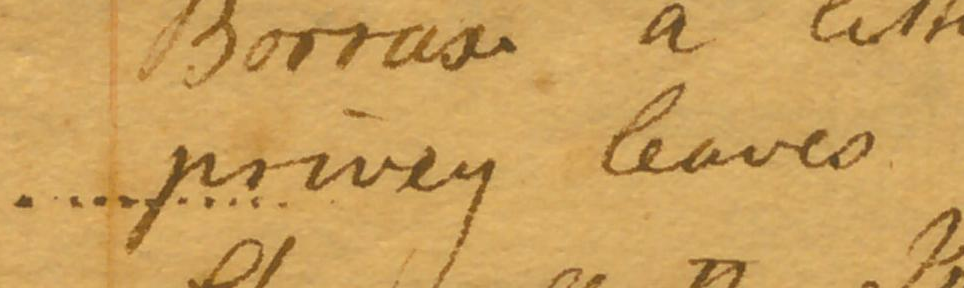privey leaves
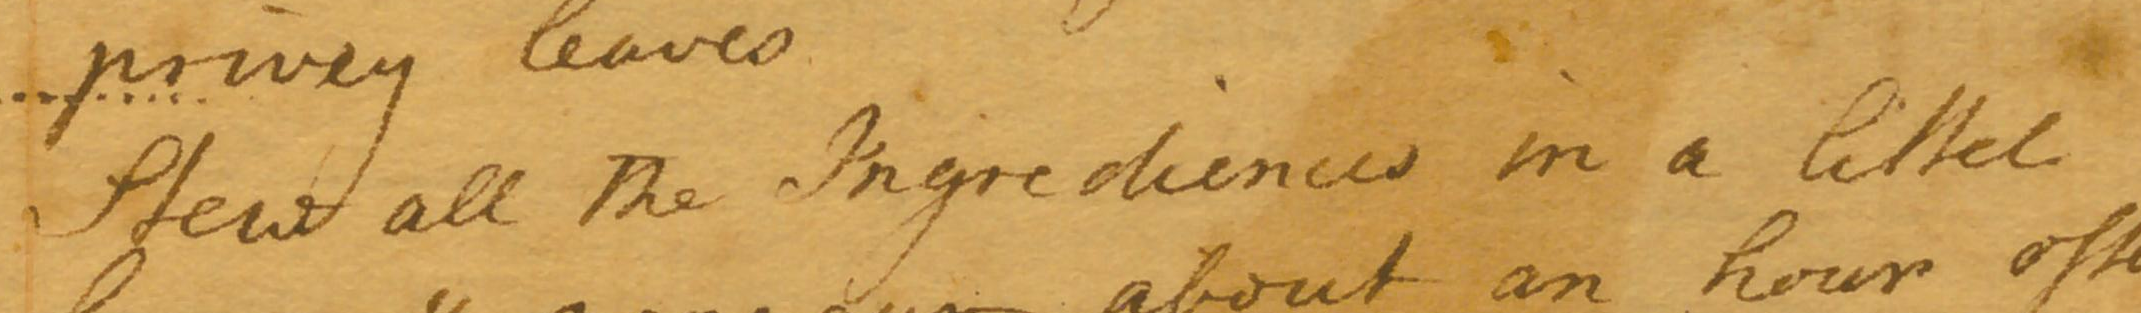Stew all the Ingrediences in a littel
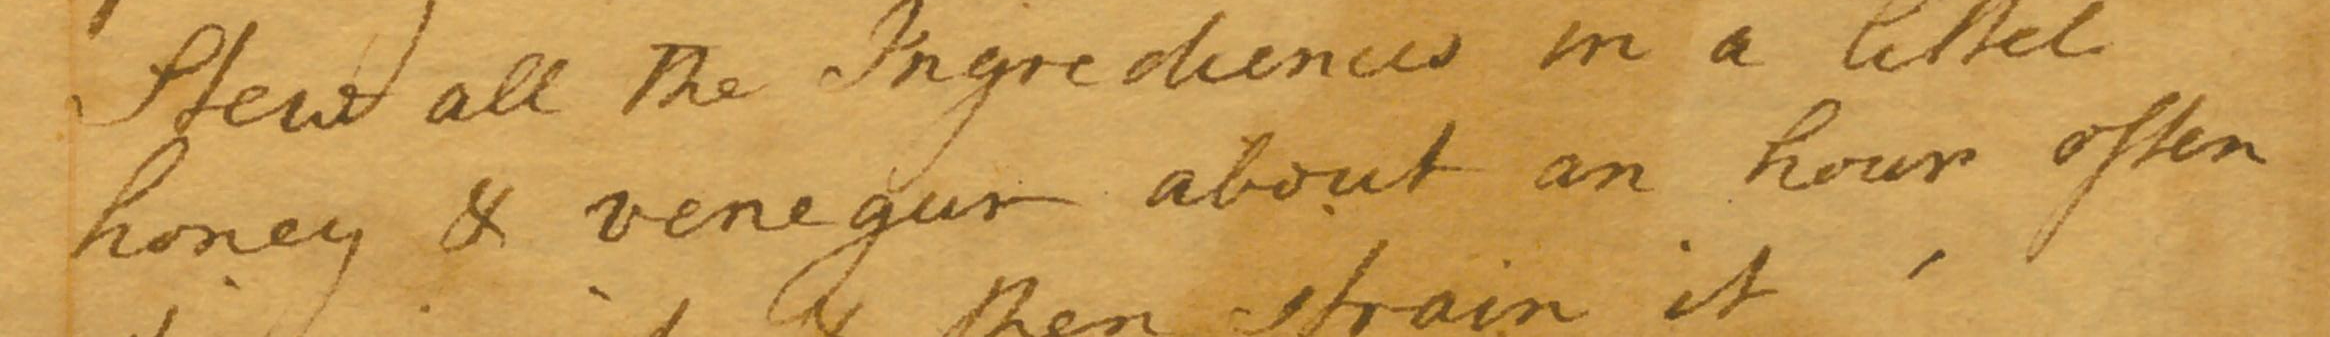honey & venegur about an hour often
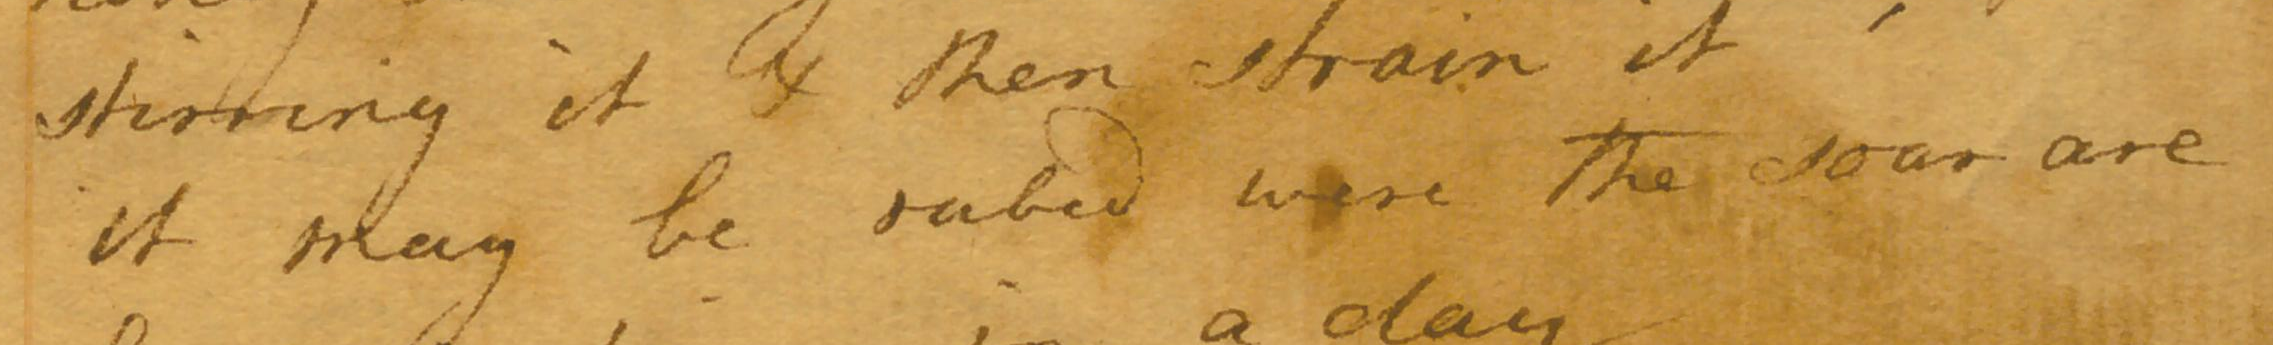it may be rubed were the soar are
